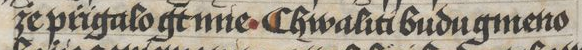że pṙigalo ḡt mie.Chwaliti budu gmeno
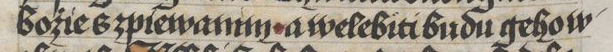bożie s zpiewanim.a welebiti budu gehow¬
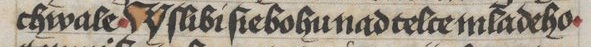chwale.Yſlibi ſiebohu nad telce mladeho.
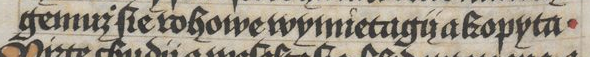gemuż ſie rohowe mietagij akopyta.
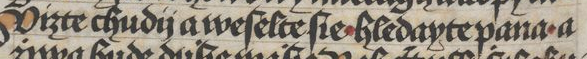Vizte chudij a weſelte ſie.hledayte pana.a
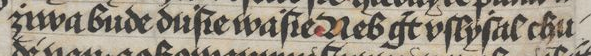żiwa bude duẛie waẛie.Neb ḡt vslyẛal chu¬
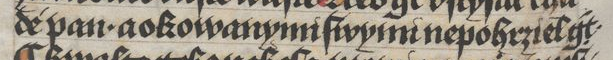dé pan.a okowanymi ſwymi nepohrziel ḡt
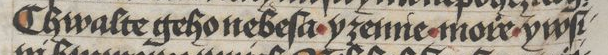Chwalte geho nebeſa.y zemie.moṙe.y wſi¬
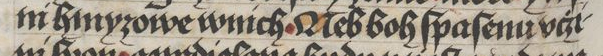ni hmyzowe wnich.Neb boh ſpaſenu vcżi¬
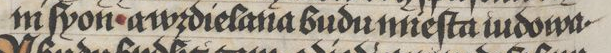ni ſyone.awzdielana budu mieſta iudowa.
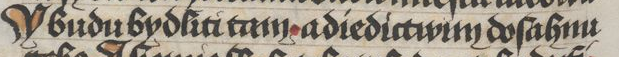Y budu bydliti tam.a diedictwim doſahnu
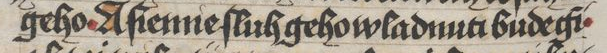geho.A ſiemie ſluh geho wladnuti bude gī.
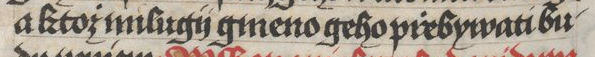a ktoż milugij gmeno geho pṙebywati bu¬
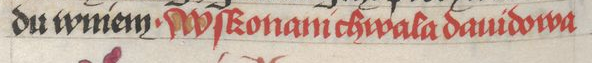du wniem.Wſkonaní chwala dauidowa
